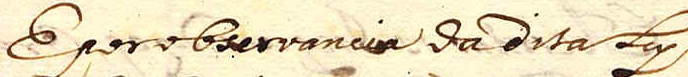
E por observancia da dita Ley
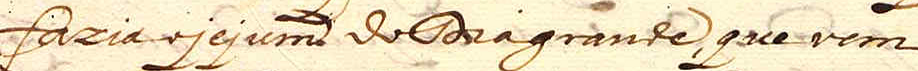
fazia o jejum do Dia grande, que vem
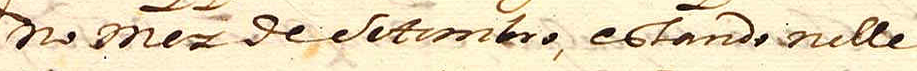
no mez de setembro, estando nelle
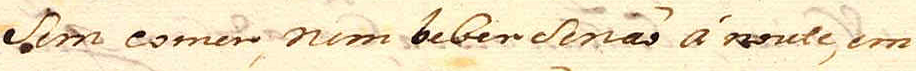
sem comer, nem beber senaõ á noute, em
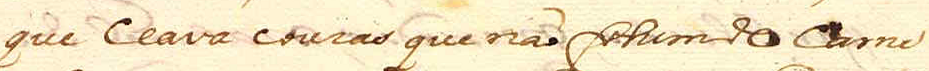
que Ceava couzas que naõ fossem de Carne
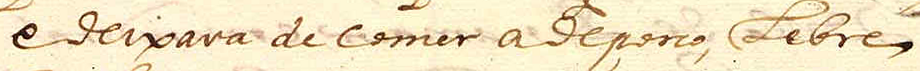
e deixava de comer a de porco, Lebre,
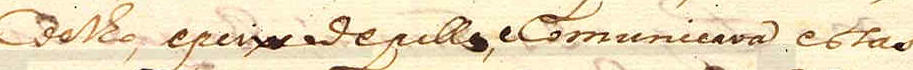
Coelho, e peixe de pelle, e Comunicava estas
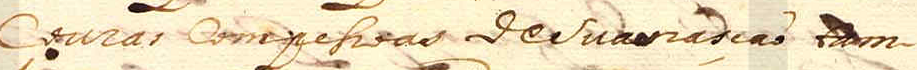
Couzas Com pessoas de sua nasçaõ tam
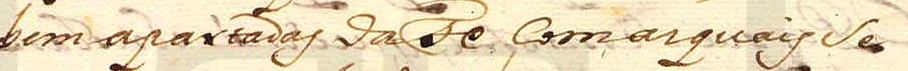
bem apartadas da Fe, com as quais se
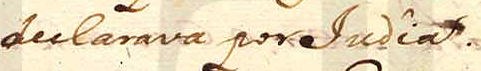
declarava por Iudia.
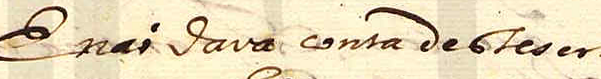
E naõ dava conta destes er
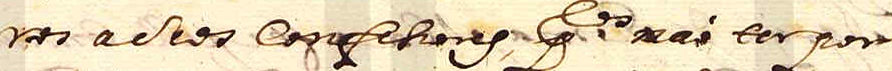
ros a seos confessores, plos naõ ter por
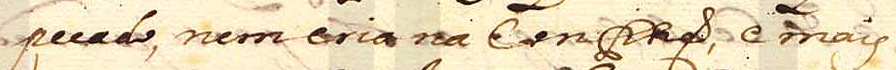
pecado, nem cria na Confissaõ, e mais
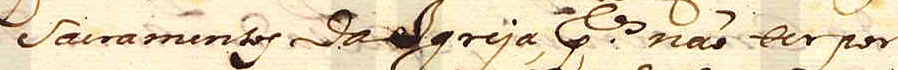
sacramentos da Igreja, p.los naõ ter por
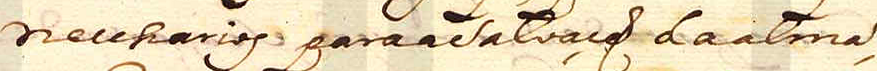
necessarios para a salvaçaõ da alma,
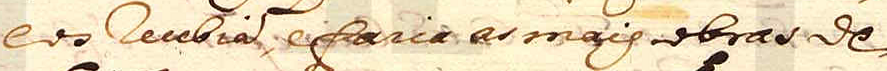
e os Recebia, e fazia as mais obras de
